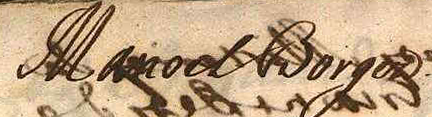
Manoel Borgez
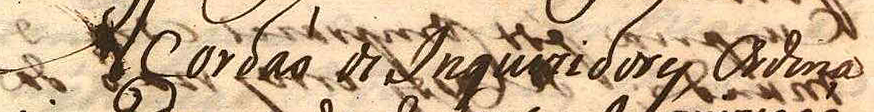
Acordaõ os Inquizidores Ordina
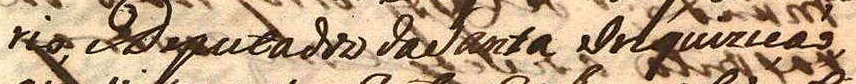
rio e Deputados da Santa Inquiziçaõ
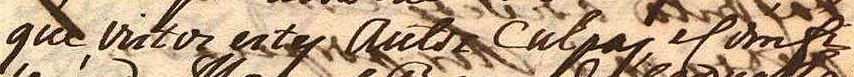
que vistoz estes autos Culpas, e Comfi
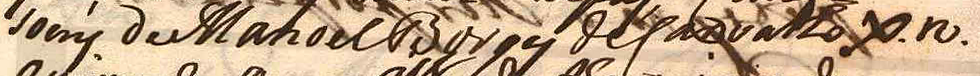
soens de Manoel Borges de Carvalho x. n.
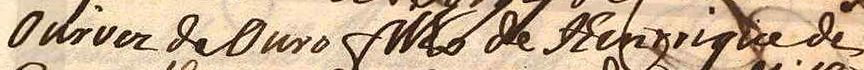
Ourivez de Ouro filho de Henrrique de
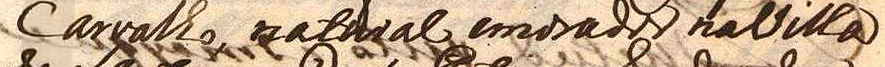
Carvalho, natural e morador na villa
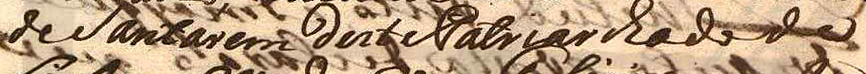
de Santarem deste Patriarchado de
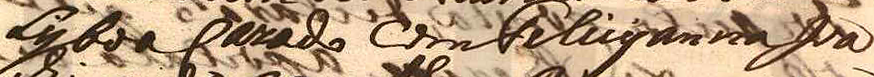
Lisboa Cazado com Felicyania Joa
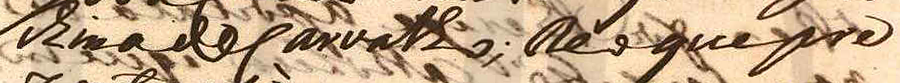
china de Carvalho; Reo que pre
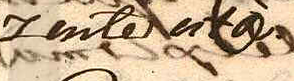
zente està.
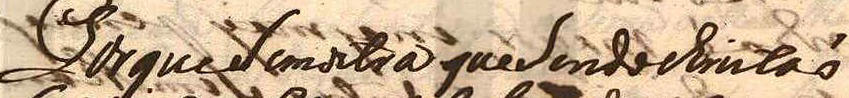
Porque se mostra que sendo christaõ
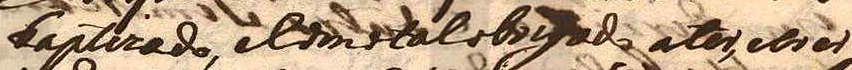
baptizado, e como tal obrigado a ter, e crer
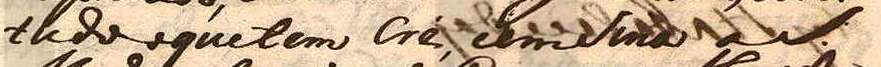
tudo o que tem cré, e emsina a S.
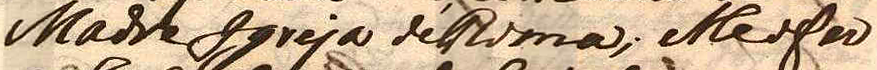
Madre Jgreja de Roma; elle o fez
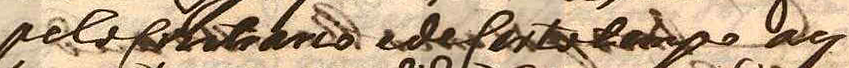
pelo Contrario e de Certo tempo a es
